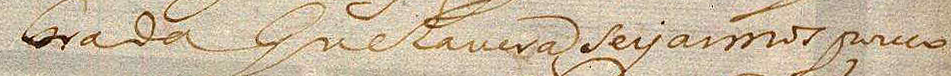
brada Que hauera seis annos pouco
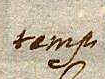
temp
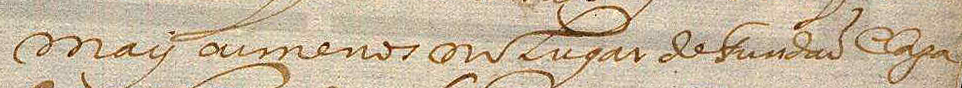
mais ou menos no Lugar do Fundaõ E Caza
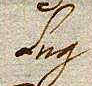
Lug
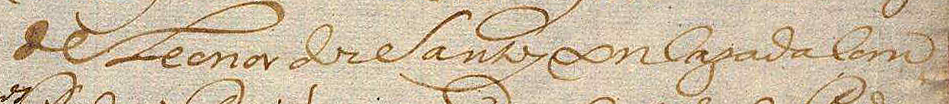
de Leonor dos santos xn Cazada Com
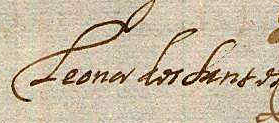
Leonor dos Santos
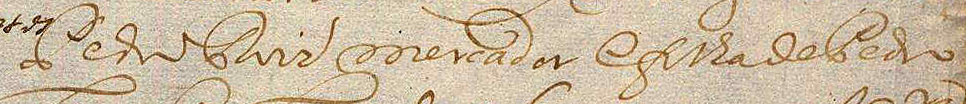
Pedro Roiz̄ mercador E filha de Pedro
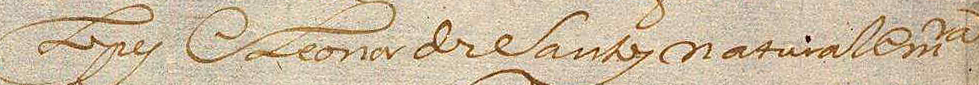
Lopes E Leonor dos Santos natural E m.ra
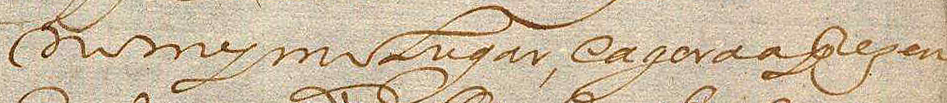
no mesmo Lugar, e agora apRezen
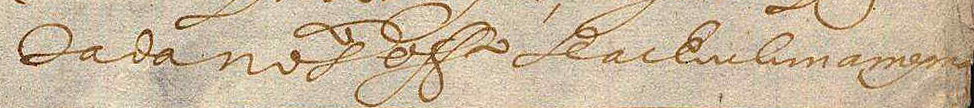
tada no sto offo se achou Com a mesm
